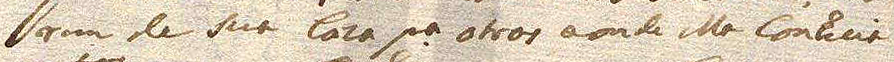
ram de sua Caza p.a otras aonde ella Conhecia
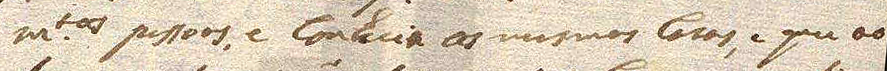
m.tas pessoas, e Conhecia as mesmas Cazas, e que ao
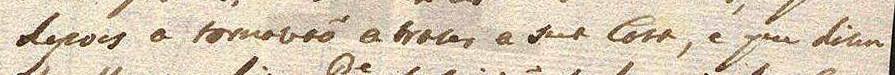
depois a tornavaõ a trazer a sua Caza, e que dizen
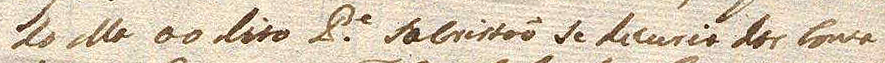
do ella ao dito P.e sacristaõ se decuria dar Conta
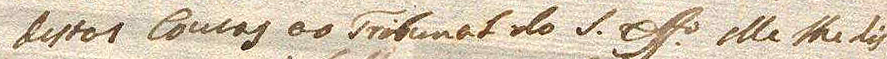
destas Couzas ao Tribunal do s. Off.o elle lhe dis
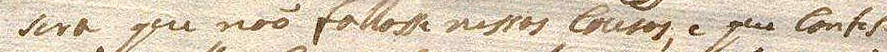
sera que naõ fallasse nessas Cousas, e que Confes
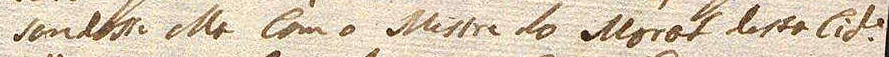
sandosse ella Com o Mestre do Moral desta Cid.e
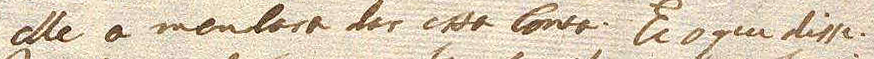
elle a mandara dar esta Conta. he o que disse.
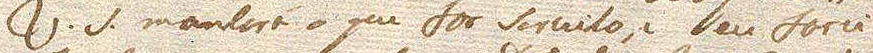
V. s. mandará o que for seruido, e eu farei
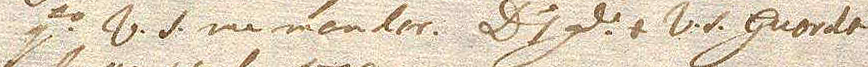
q.to V. s. me mandar. Ds̄ g.e a V. S. Guarda
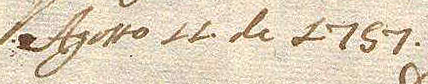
Agosto 11. de 1757.
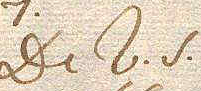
De V. s.
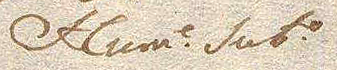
Hum.e sub̄.o
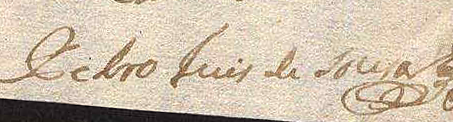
Pedro Luis de Souza
